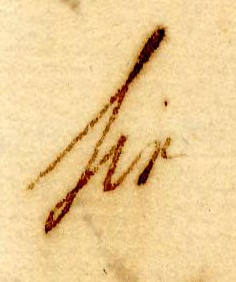Sir
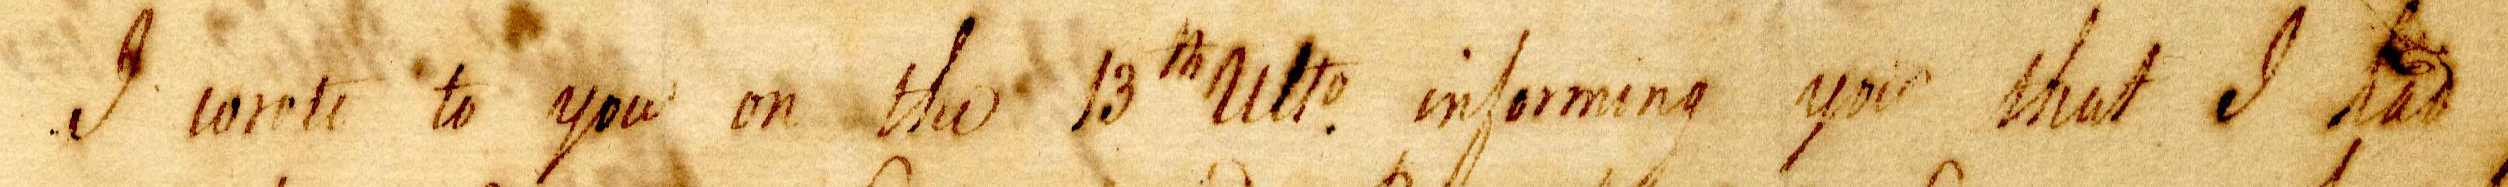I wrote to you on the 13^th Ult^o informing you that I had
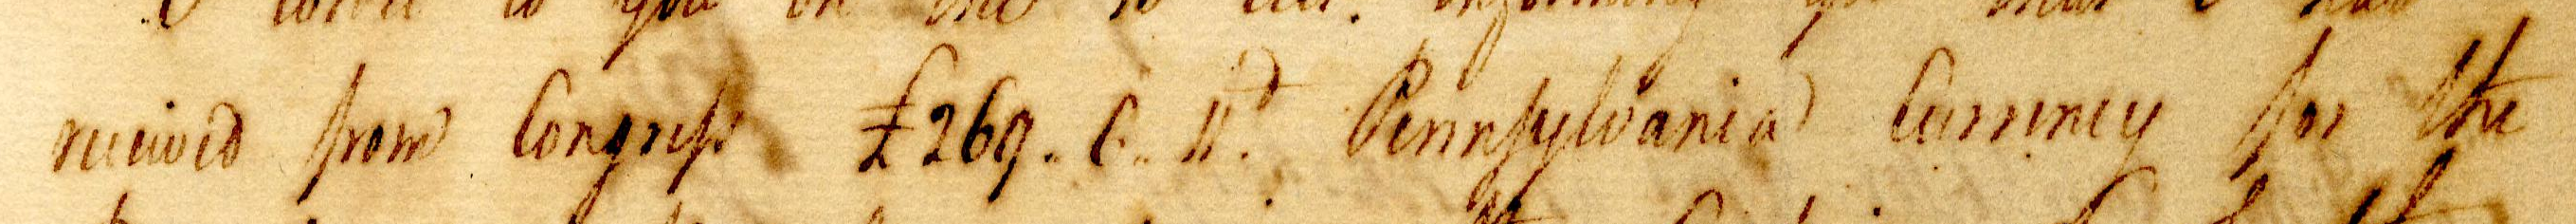received from Congress £269.6.11^d. Pennsylvania Currency for the
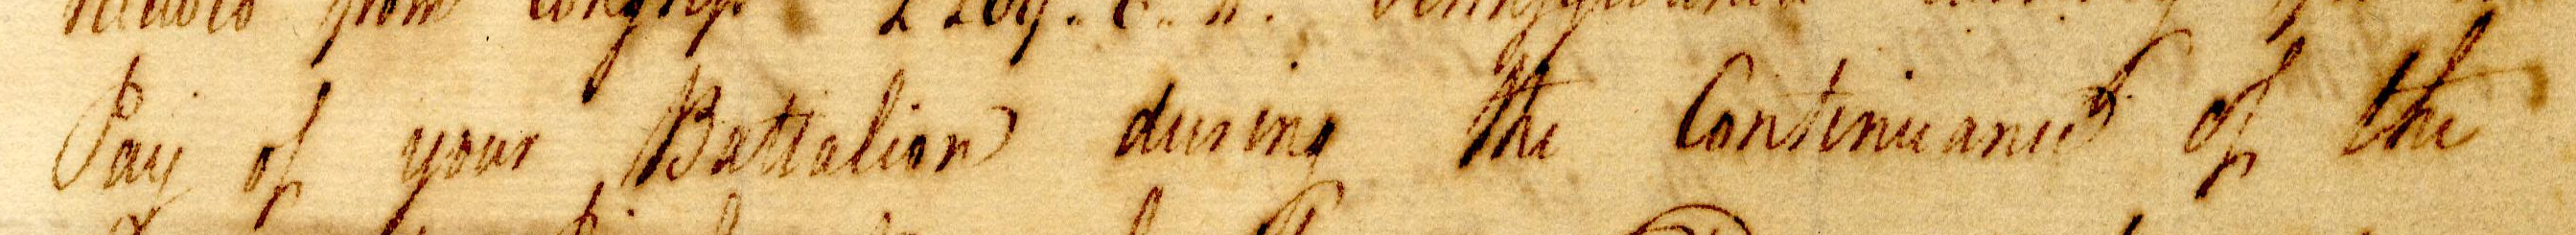Pay of your Battalion during the Continuance of the
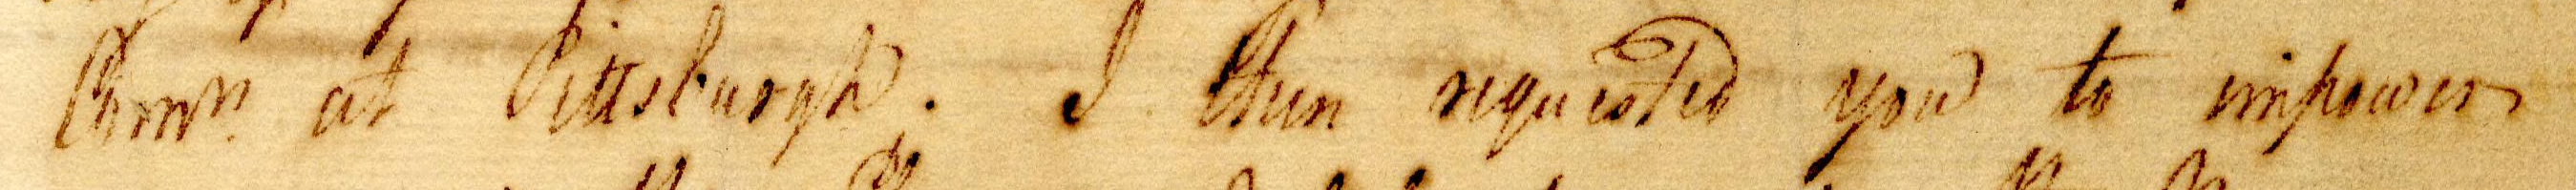Com^n. at Pittsburgh. I then requested you to impower
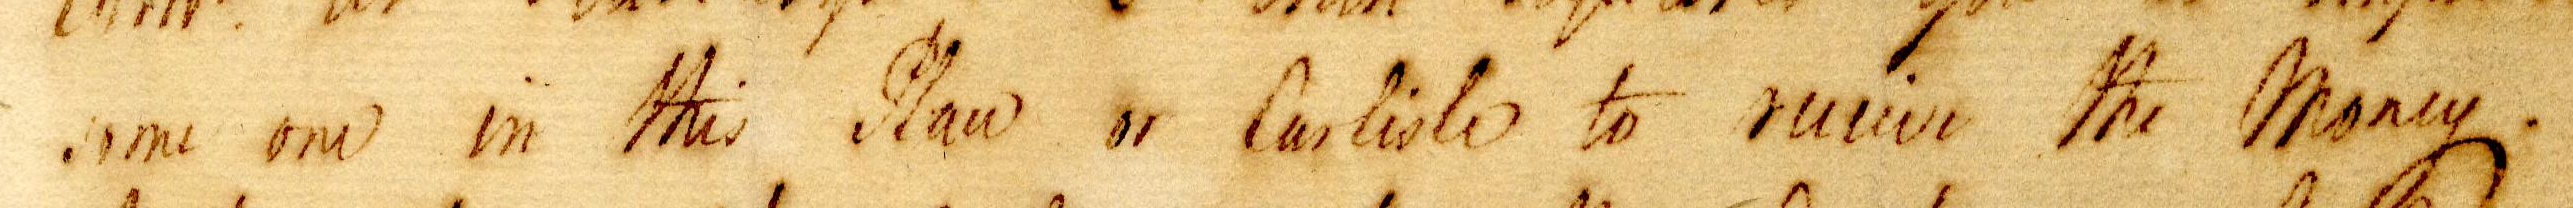some one in this Place or Carlisle to receive the Money.
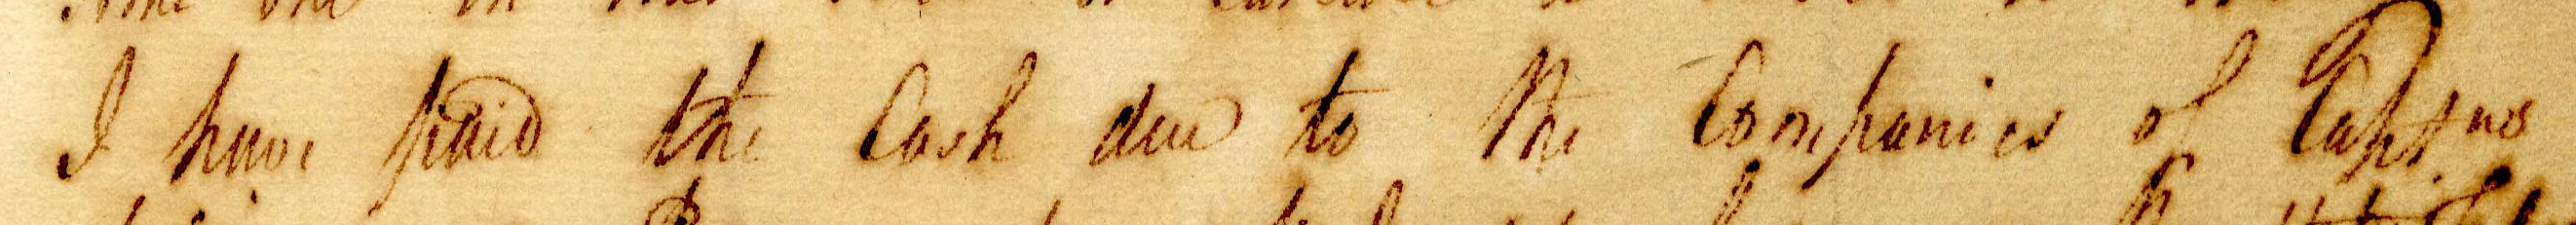I have paid the Cash due to the Companies of Capt^ns
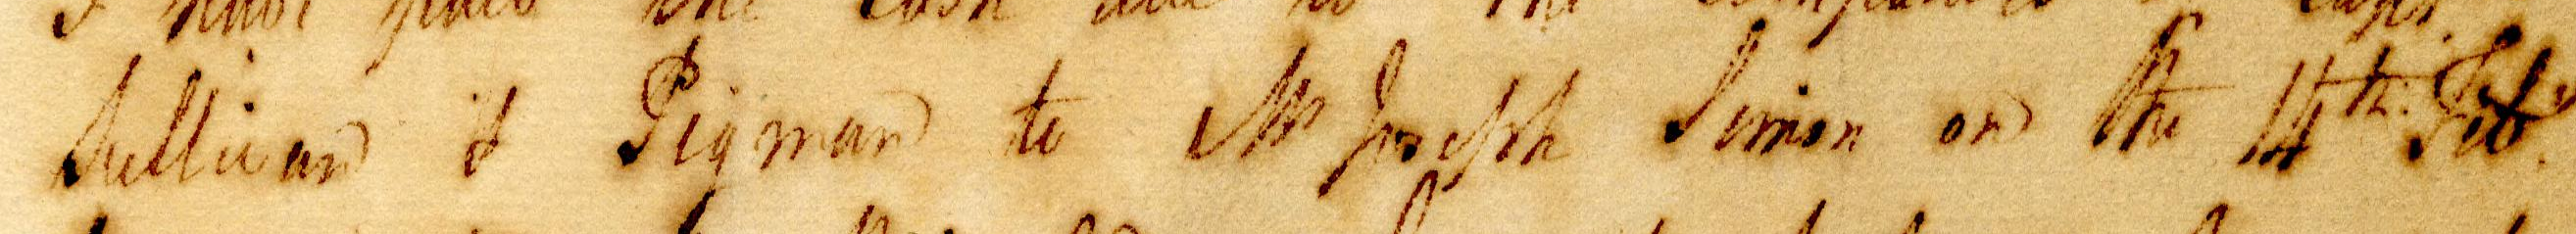Sullivan & Pigman to M^r Joseph Simon on the 14^th Feb^y
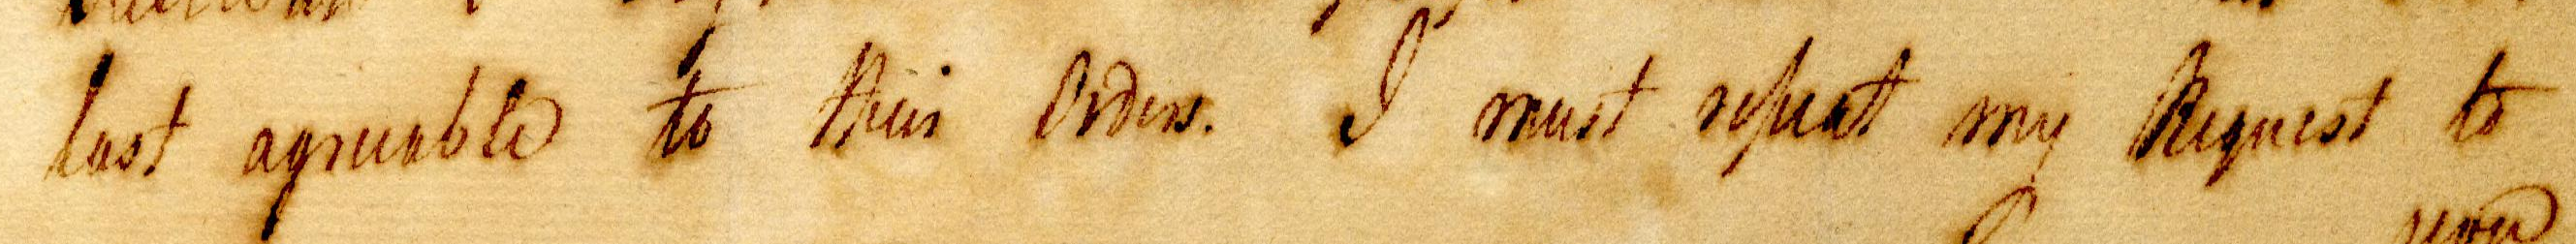last agreeable to their Orders. I must respect my Request to
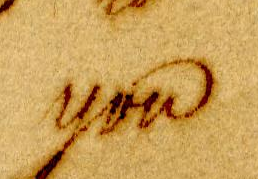you
